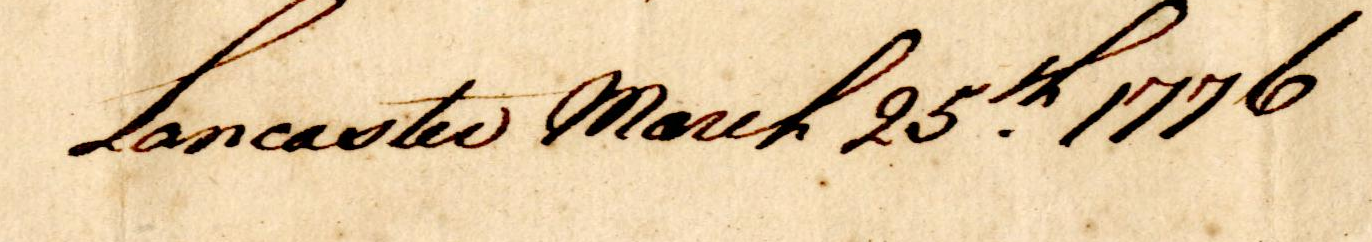Lancaster March 25^th 1776.
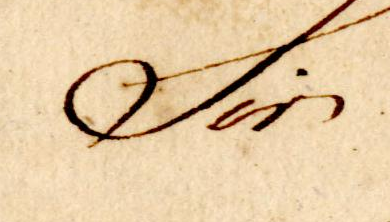Sir
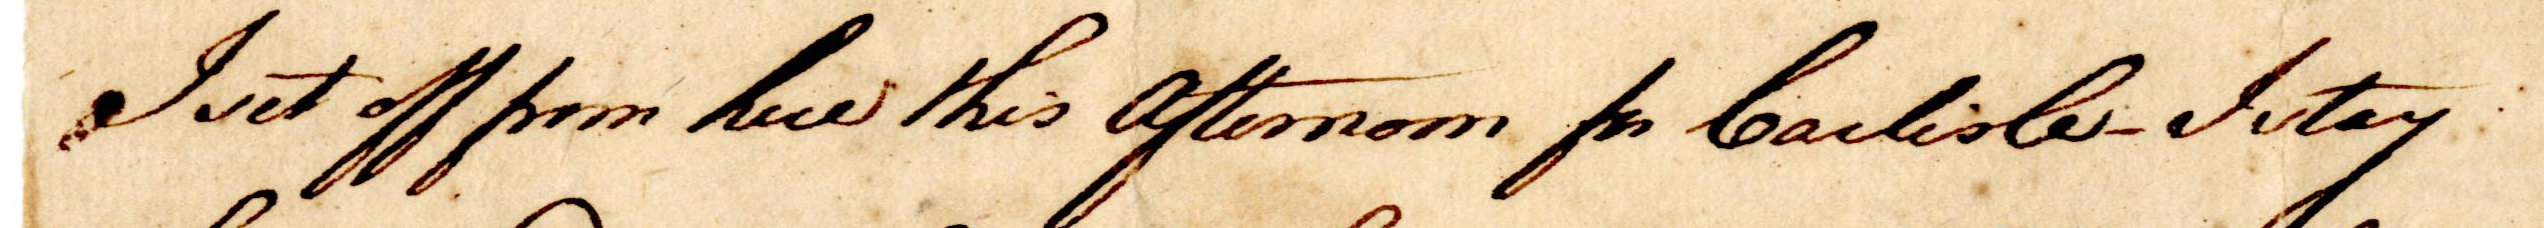I set off from here this Afternoon for Carlisle I stay
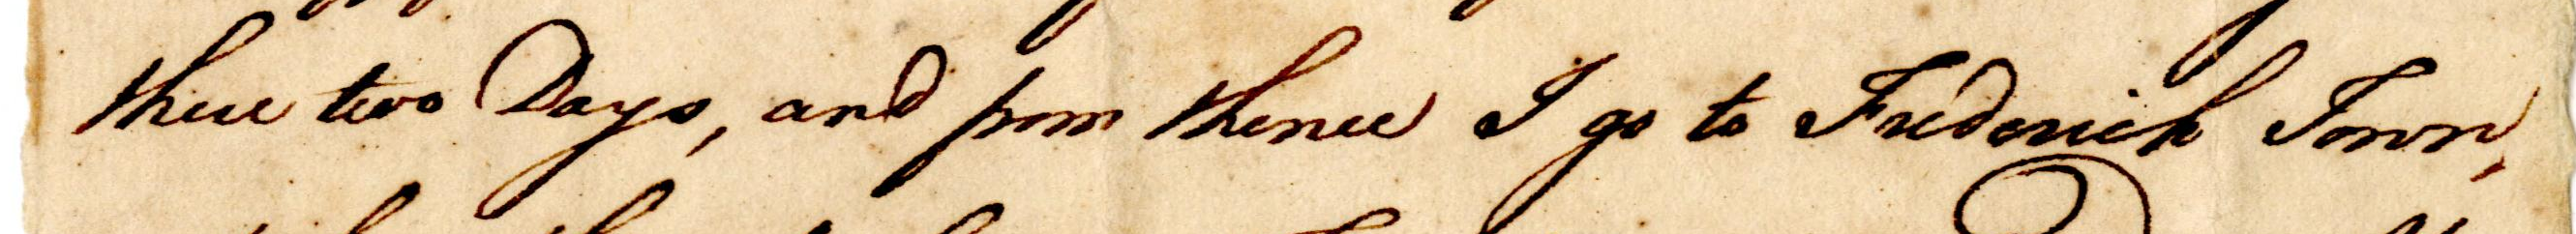there two days, and from thence I go to Frederick Town
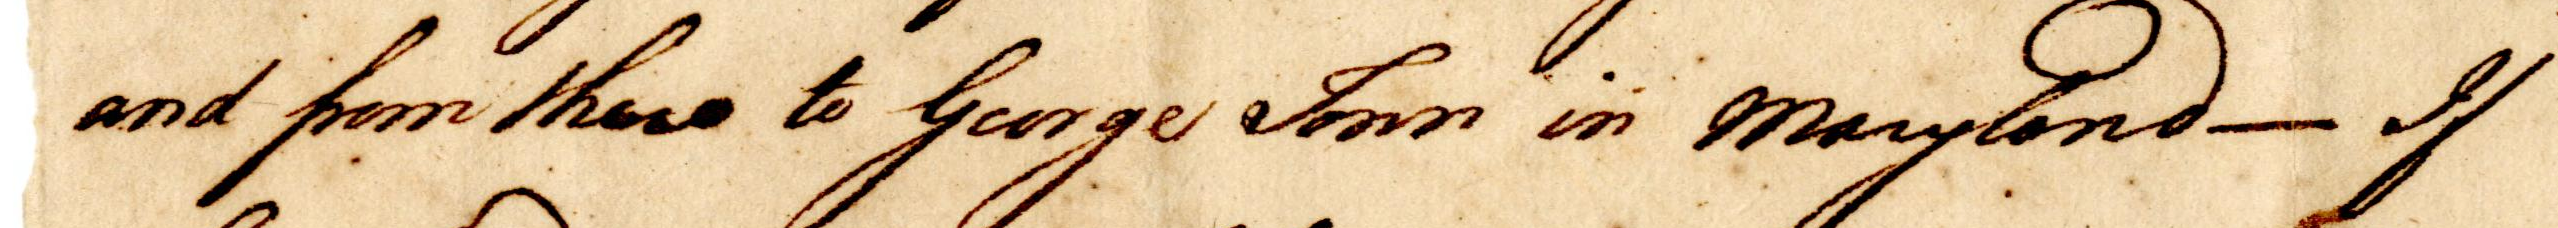and from there to George Town in Maryland- If
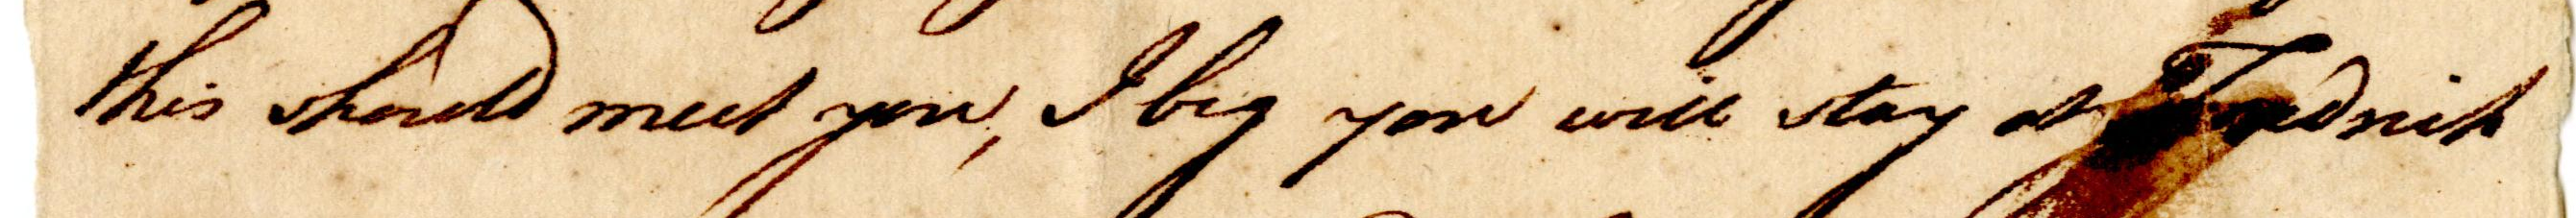this should meet you, I beg you will stay at Frederick
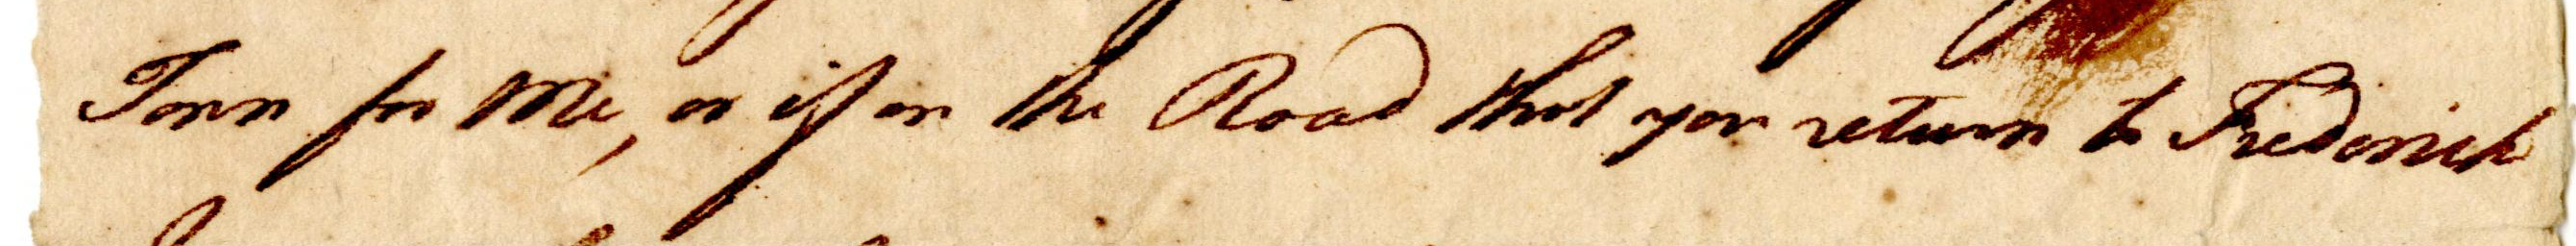Town for Me, or if on the Road that you return to Frederick
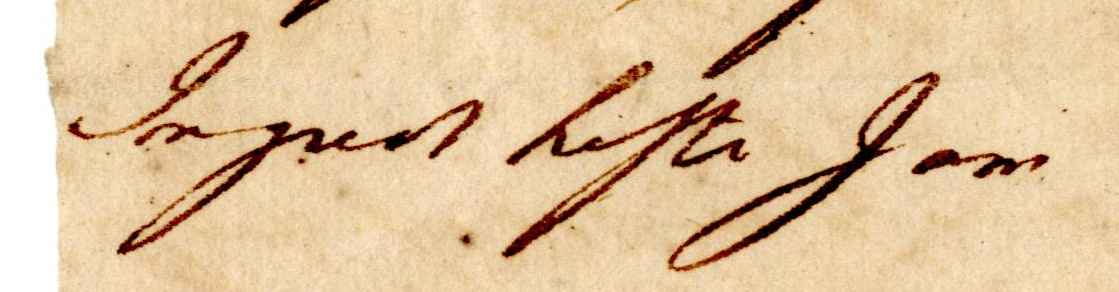In great haste I am
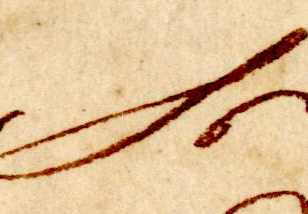Sr
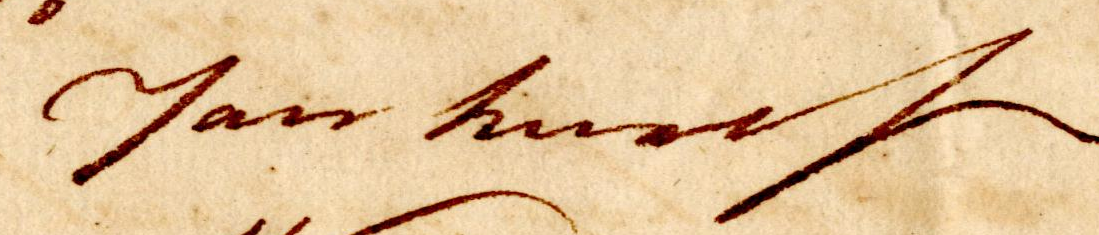Your hum^le
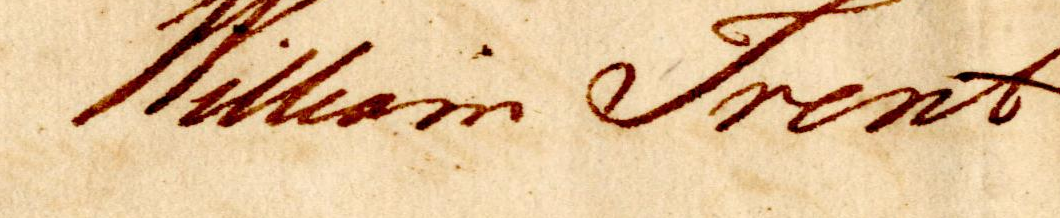William Trent
